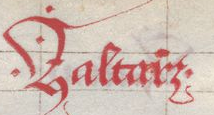.Żaltarz.
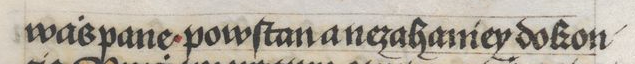waṡ pane.powſtan a nezahaniey dokon¬
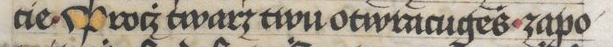cie.Procż twarz twu otwracugeš.zapo¬
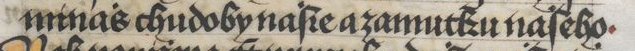mínaṡ chudoby naẛie a zamutku naẛeho.
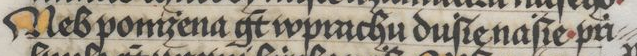Neb poníżena ḡt wprchu duẛie naẛie.při¬
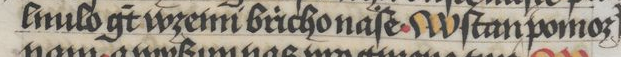lnulo ḡt wzemi bṙicho naẛe.Wſtan pomoz
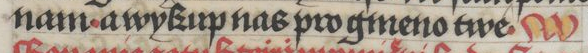nam.a wykup nas pro gmeno twé.W
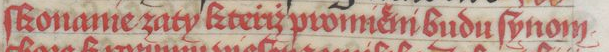ſkonaníe zaty kteṙiż promíeni budu ſynom
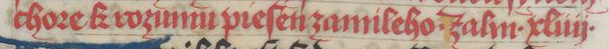choze k rozumu pieſen zamileho.Zalm.xliiij.
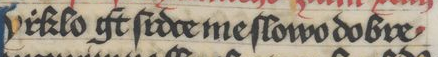Yṙklo ḡt ſrdce me ſlowo dobre.
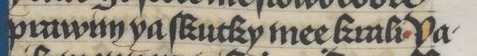prawim ya ſkutky mee krali.Ya¬
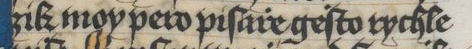zík moy pero píſaře geẛto rychle
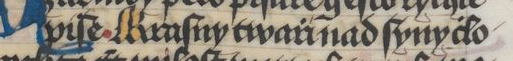píẛe.Kraſny twaṙí nad ſyny člo¬
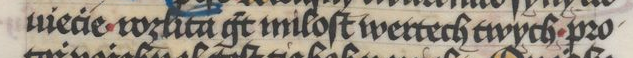uieċíe.rozlita ḡt miloſt wertech twych.pro¬
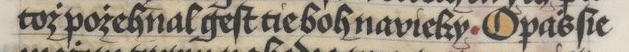toż pożehnal geſt tie boh navieky.Opaṡ ſie
